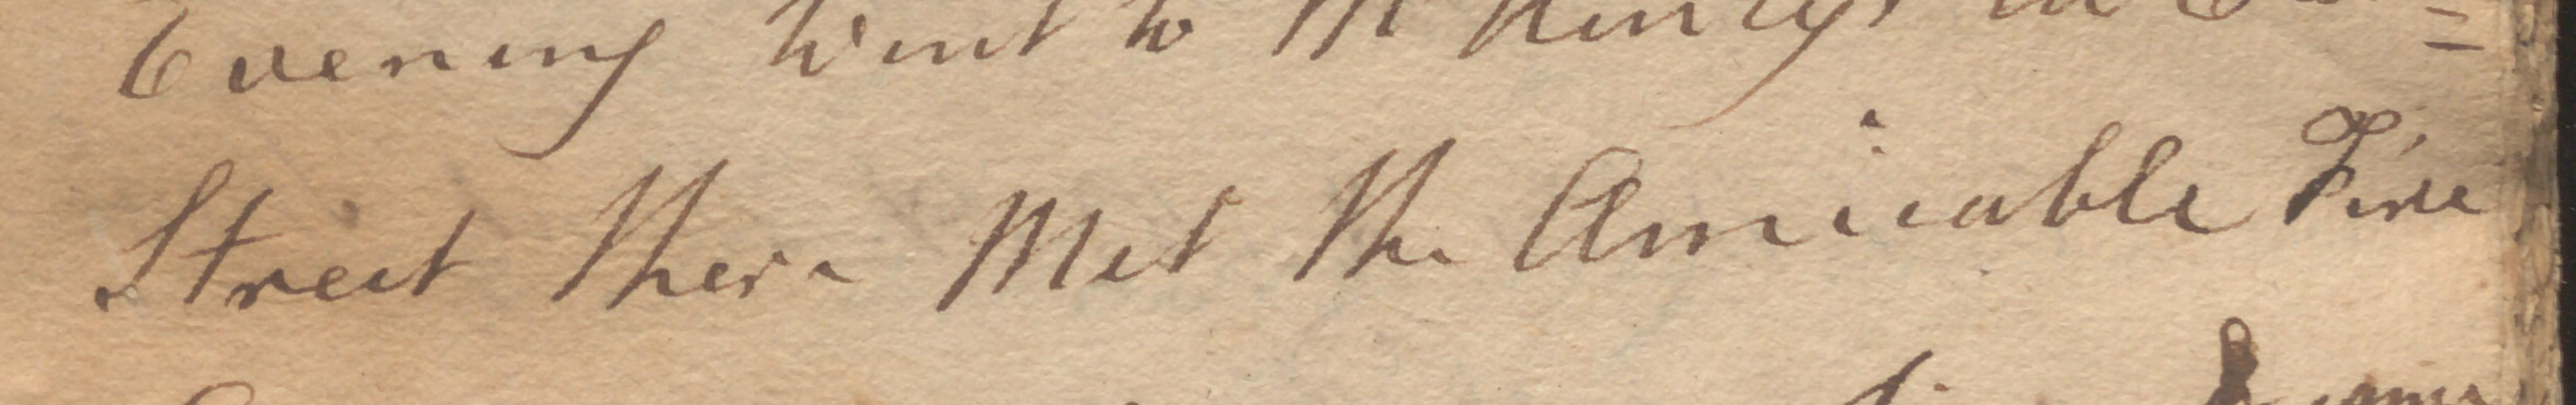Street there Met the Amicable Fire
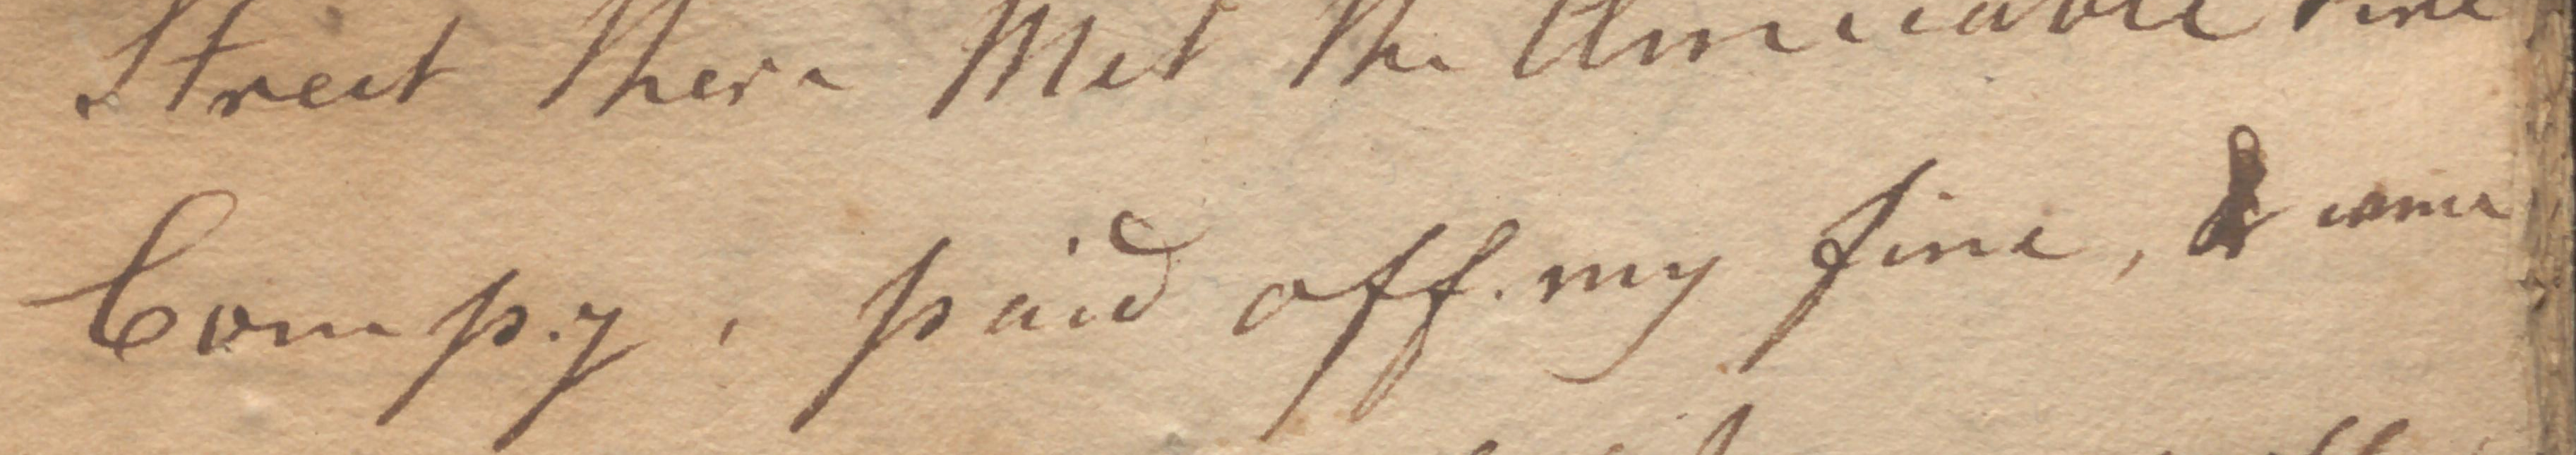Compy. paid off my fine, & came
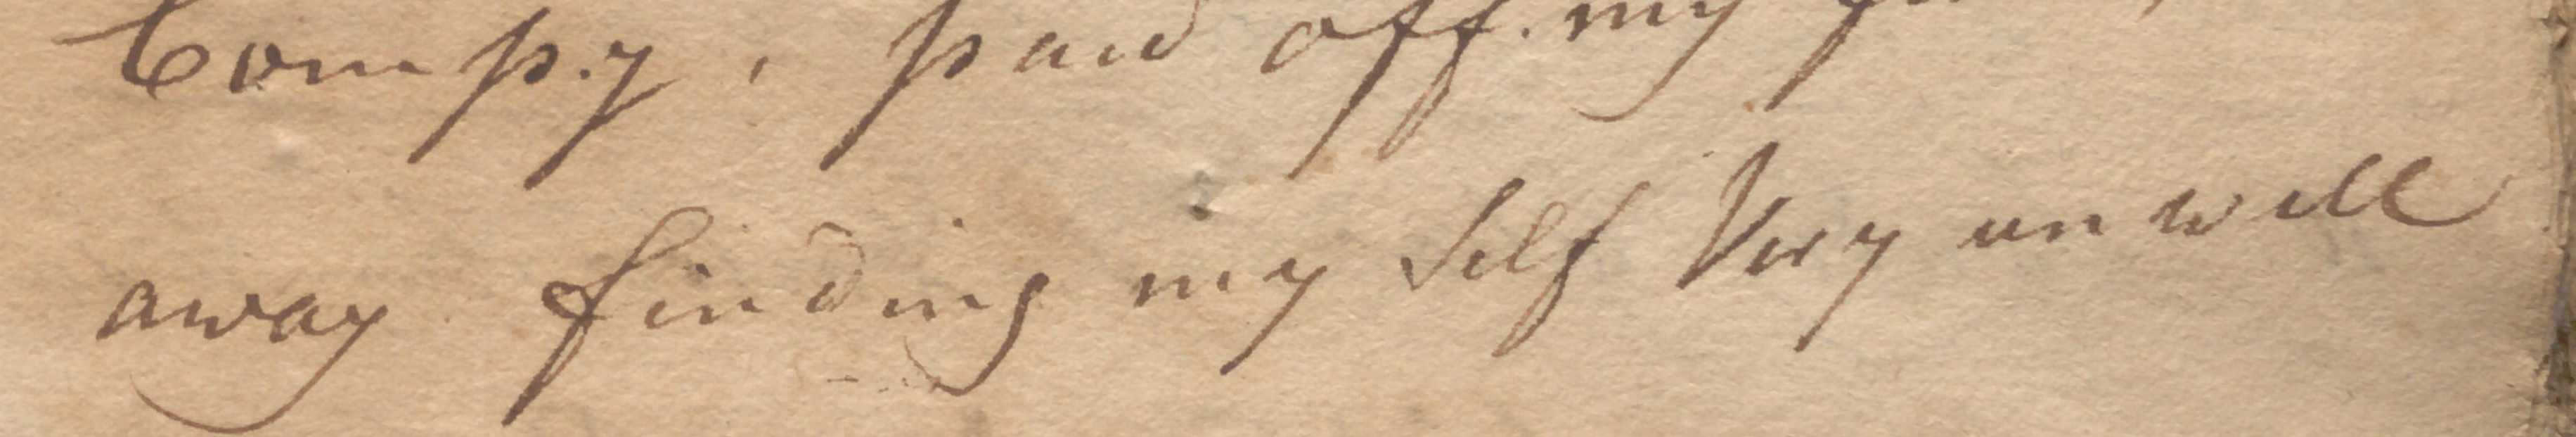away finding my self Very unwell
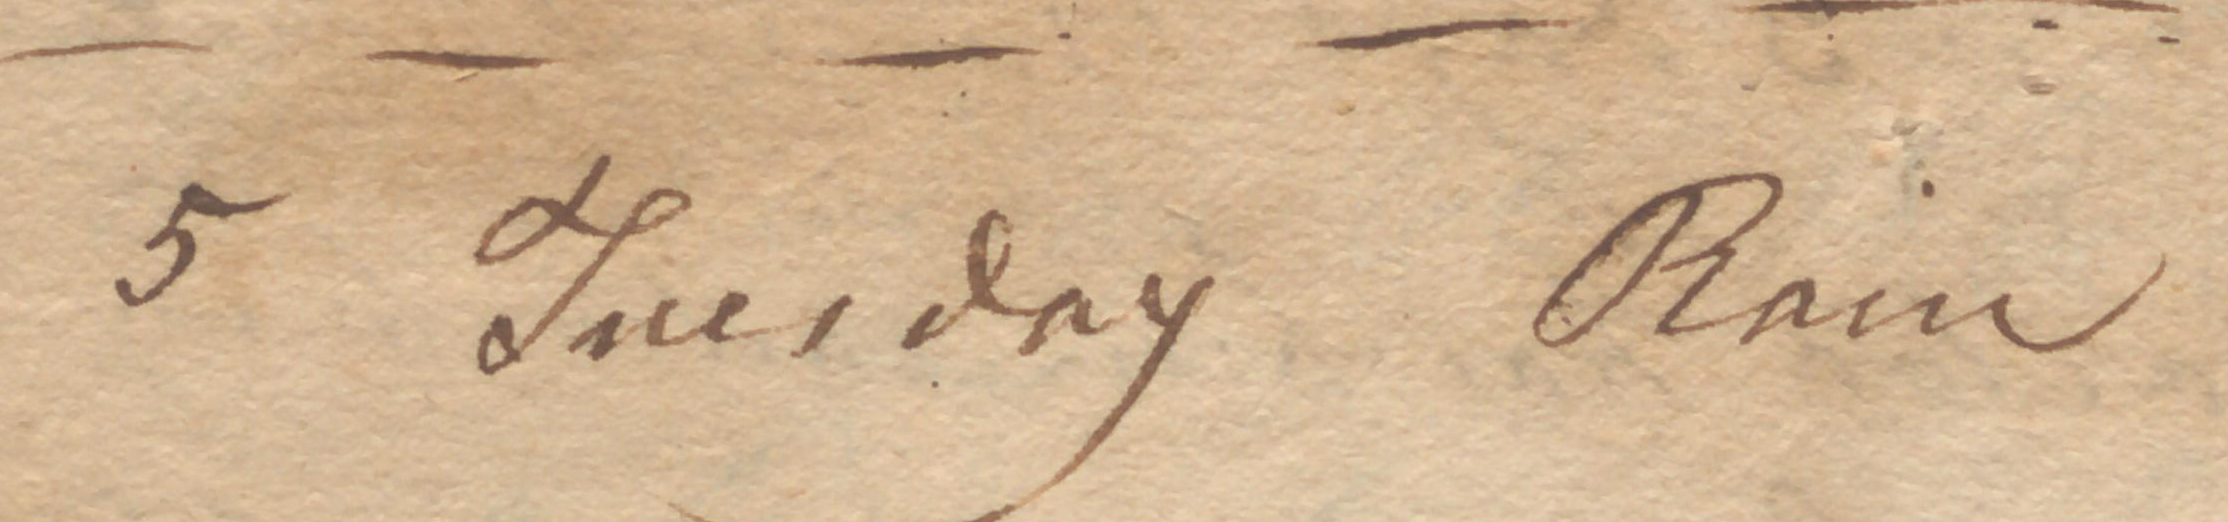5 Tuesday Rain
